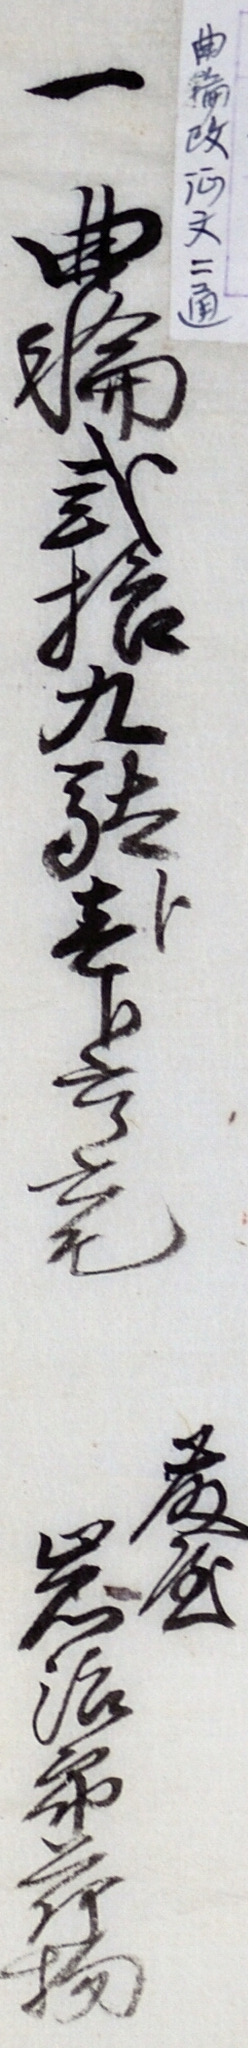一曲輪弍拾九駄ト壱分六厘六毛藤屋
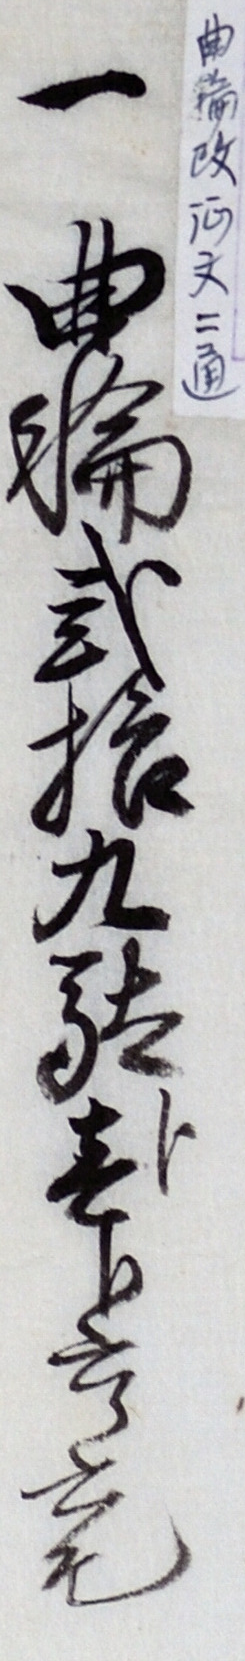一曲輪弍拾九駄ト壱分六厘六毛藤屋
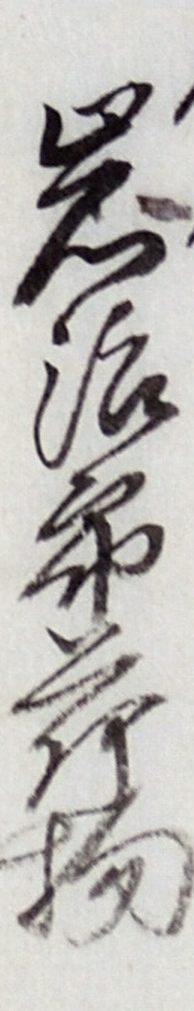岩治郎荷物
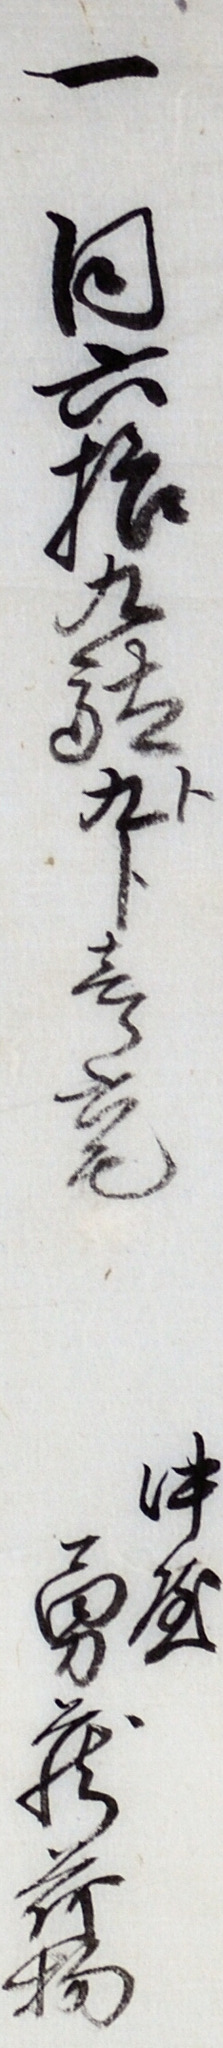一同六拾九駄ト九分壱厘六毛中屋
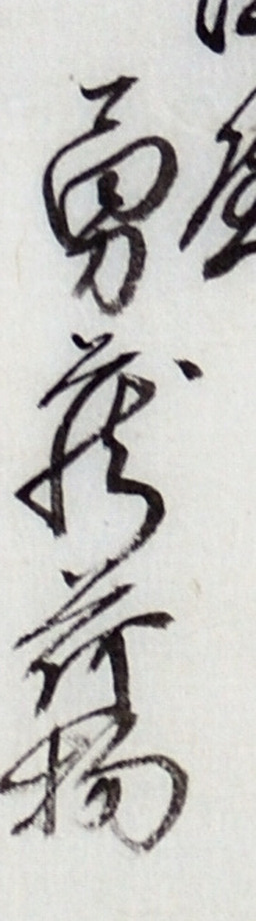勇蔵荷物
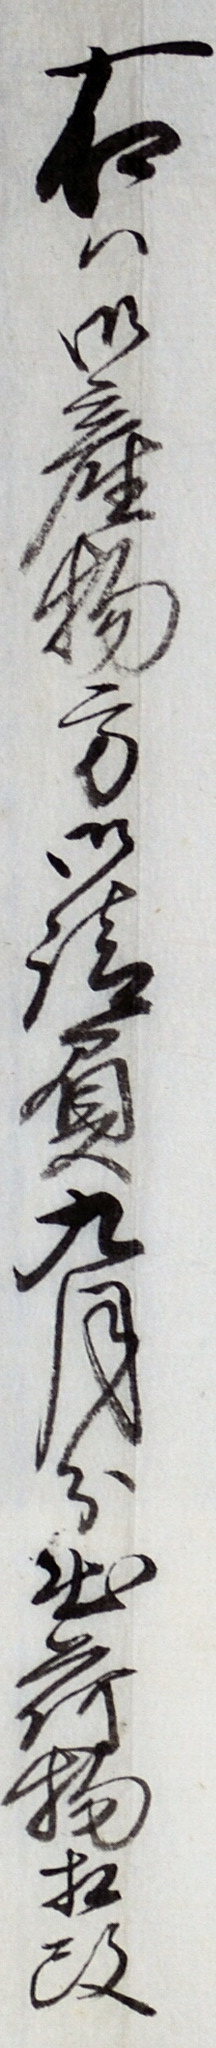右ハ御産物方御請負九月分出荷物相改
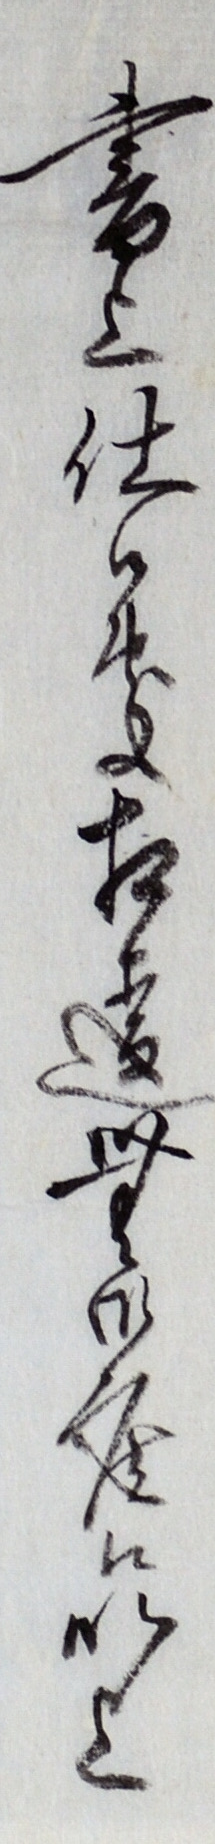書上仕候処相違無御座候以上
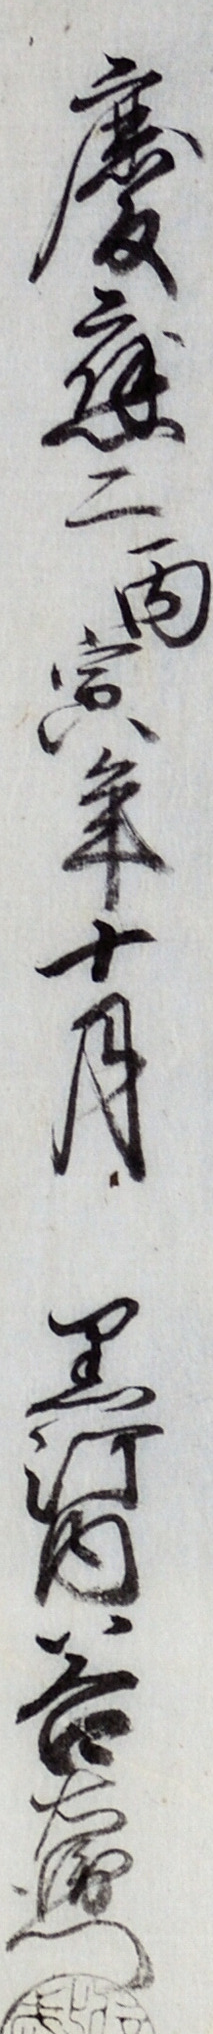慶応二丙寅年十月黒河内谷右衞門㊞
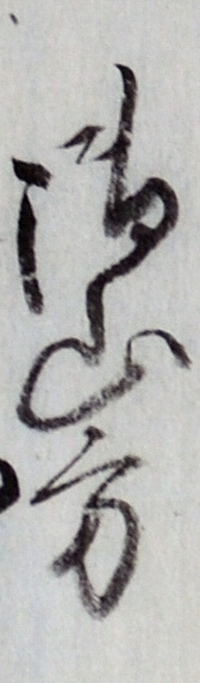御山方
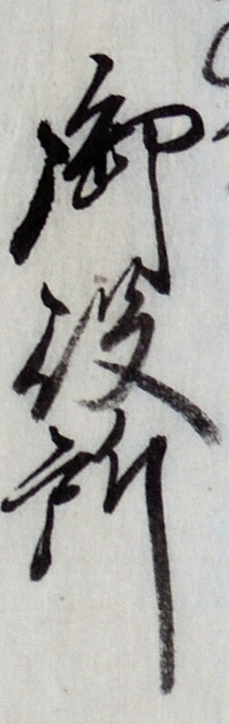御役所
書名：覚
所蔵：伊那市立高遠町図書館・合同会社AMANE
